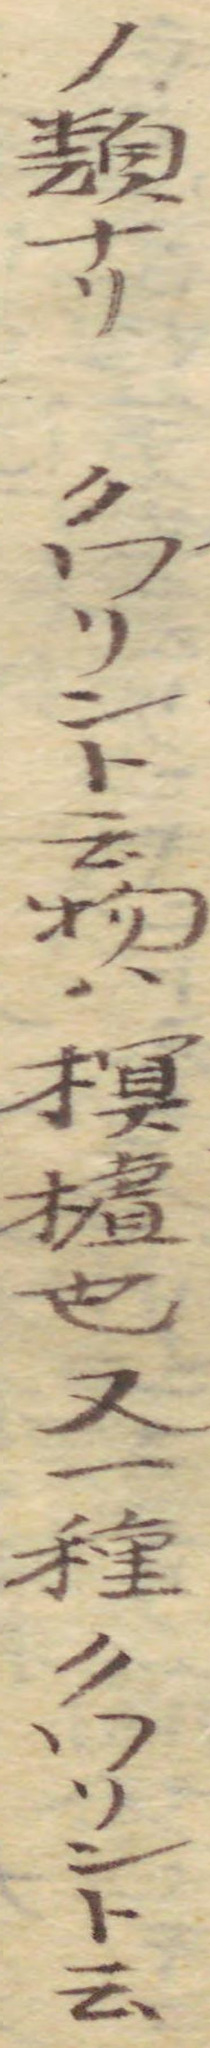ノ類ナリクワリント云物ハ榠樝也又一種クワリント云
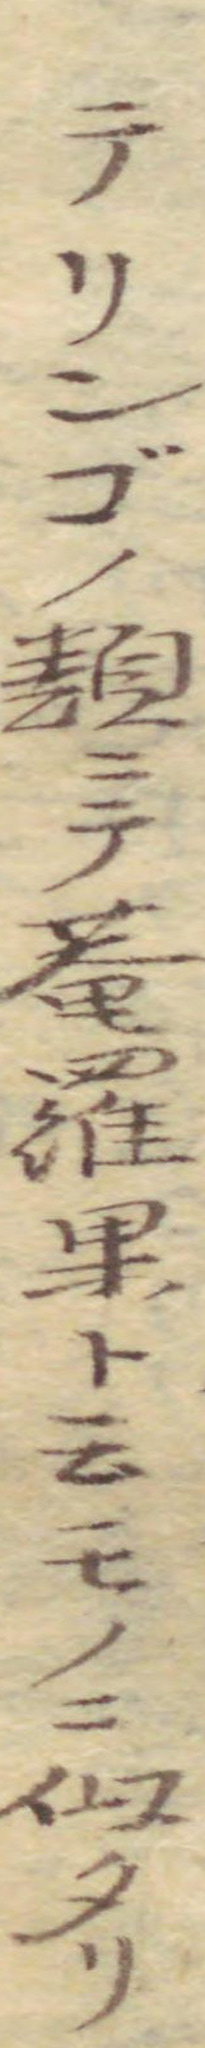テリンゴノ類ニテ菴羅果ト云モノニ似タリ
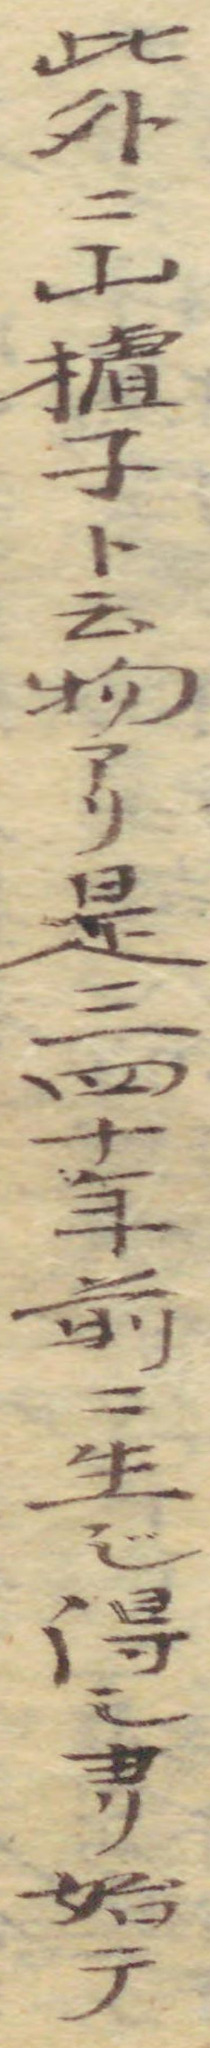此外ニ山樝子ト云物アリ是三四十年前ニ生ジ得シヨリ始テ
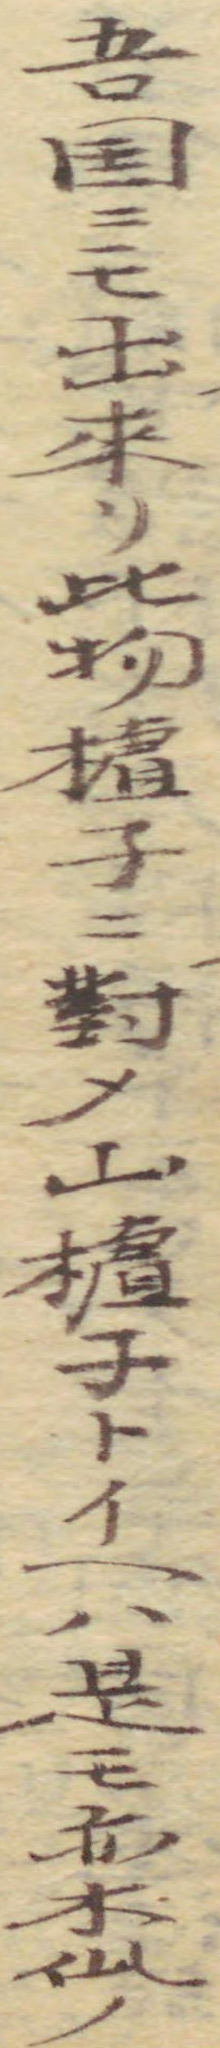吾国ニモ出来リ此物樝子ニ対シテ山樝子トイヘハ是モ亦木瓜ノ
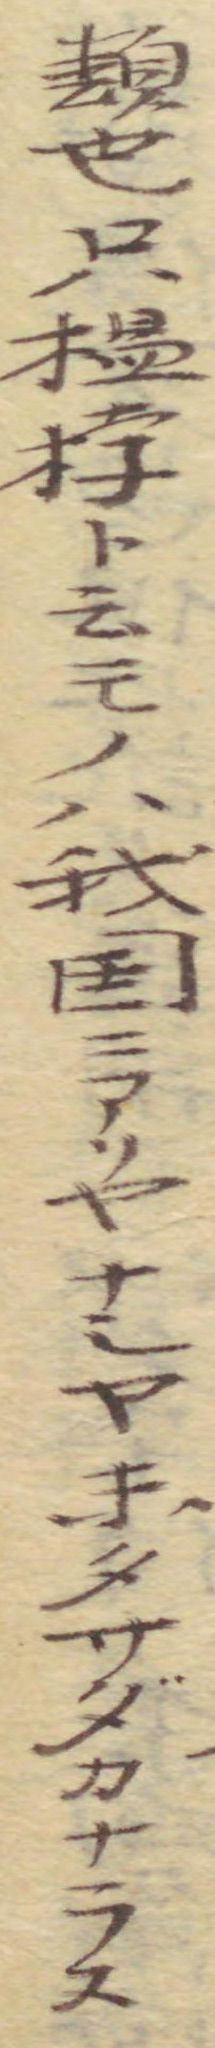類也只榲桲ト云モノハ我国ニアリヤナシヤ未タサダカナラス
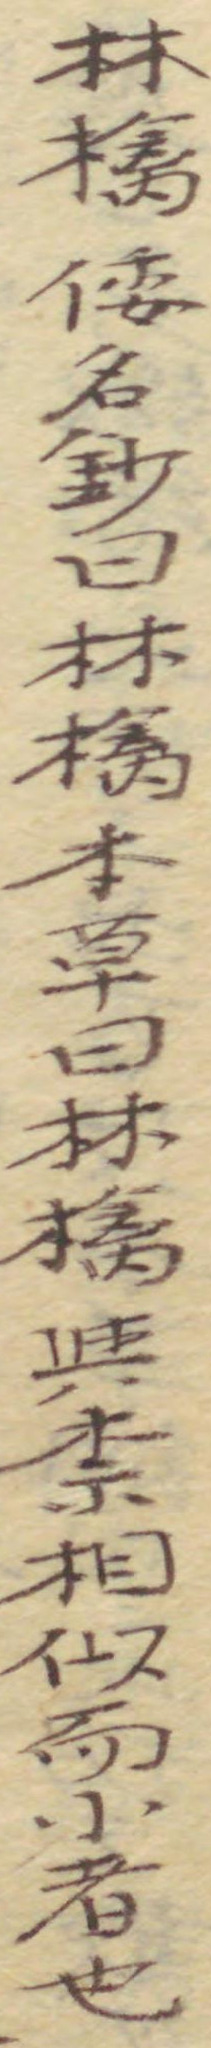林檎倭名鈔曰林檎本草曰林檎与李相似而小者也
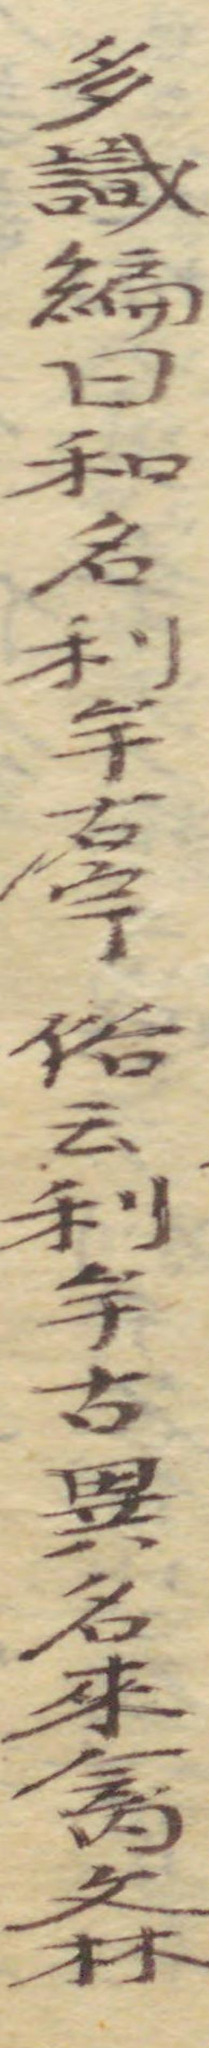多識編曰和名利牟古宇俗云利牟古異名来禽文林
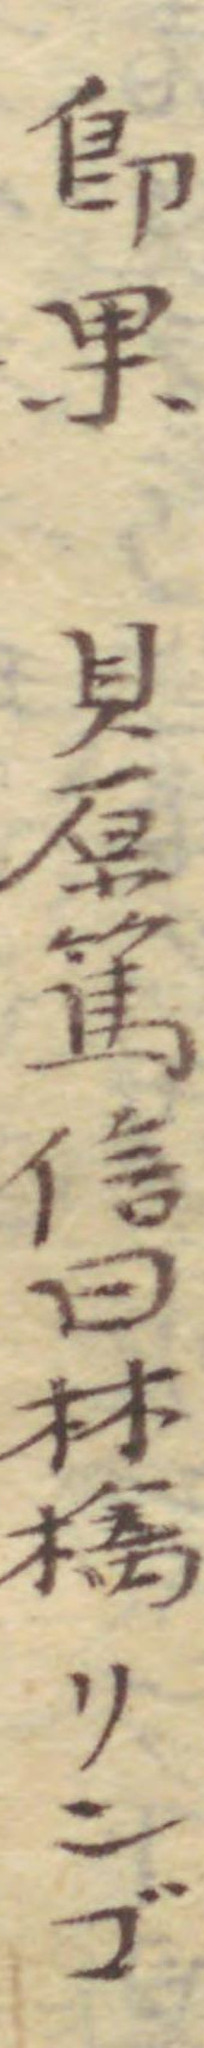即果貝原篤信曰林檎リンゴ
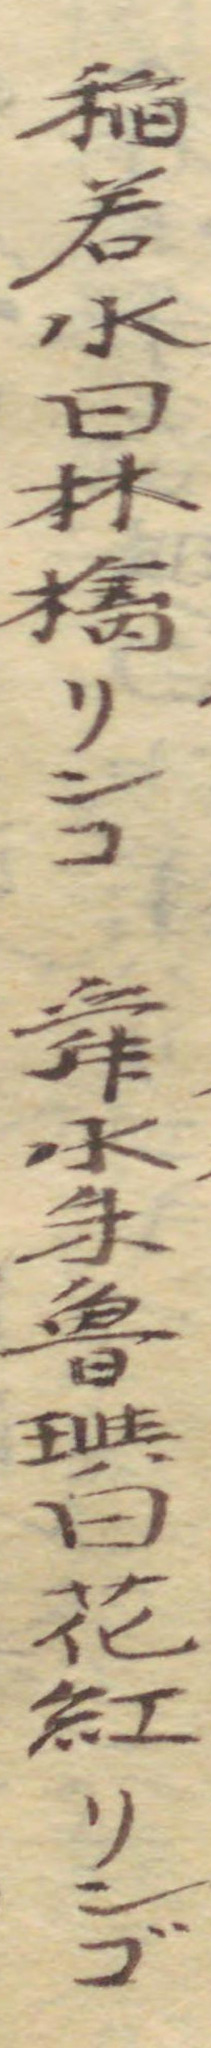稲若水曰林檎リンコ舜水朱魯璵曰花紅リンゴ
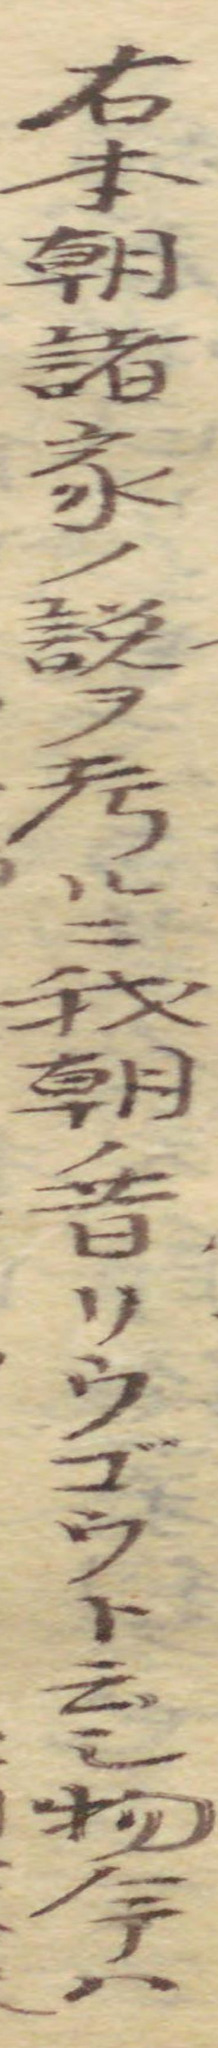右本朝諸家ノ説ヲ考ルニ我朝ノ昔リウゴウト云シ物今ハ
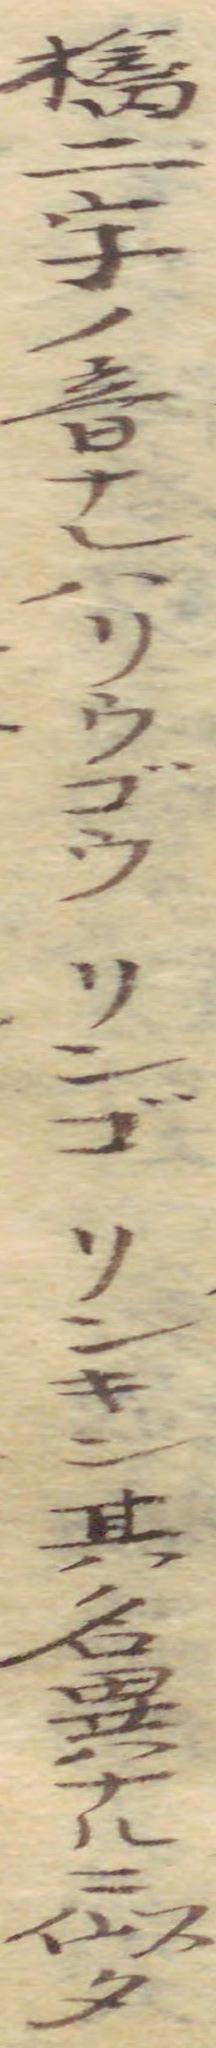檎二字ノ音ナレハリウゴウリンゴリンキン其名異ナルニ似タ
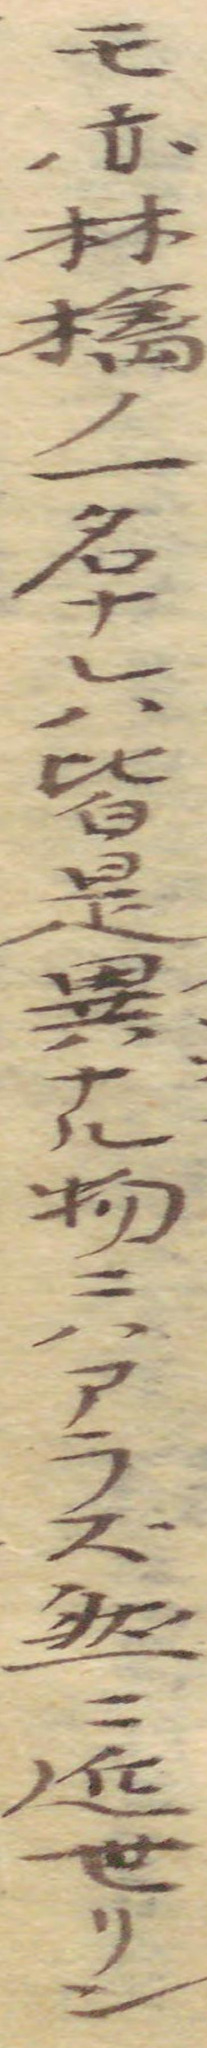モ亦林檎ノ一名ナレハ皆是異ナル物ニハアラズ然ニ近世リン
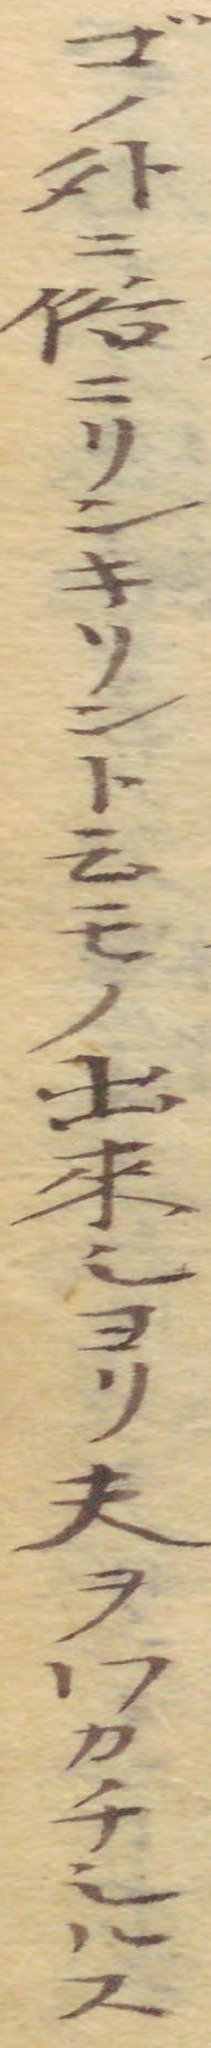ゴノ外ニ俗ニリンキソント云モノ出来シヨリ夫ヲワカチシルス

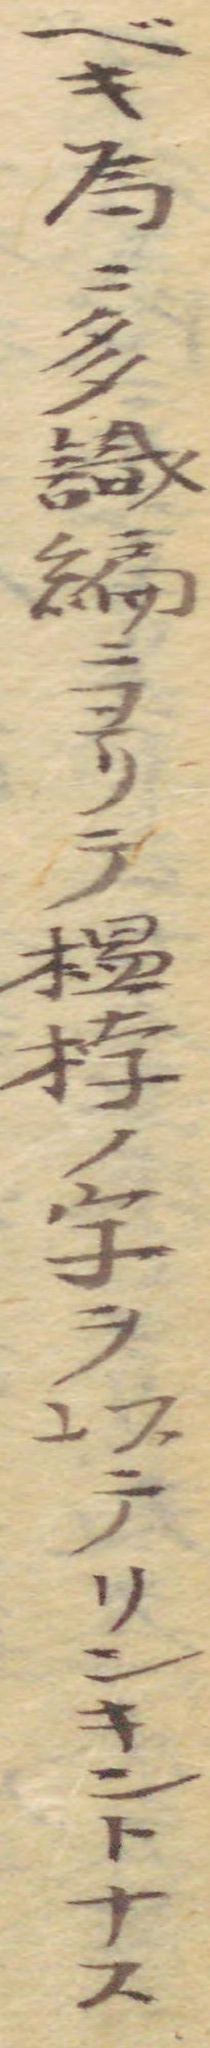ベキ為ニ多識ニヨリテ榲桲ノ字ヲ以テリンキントナス
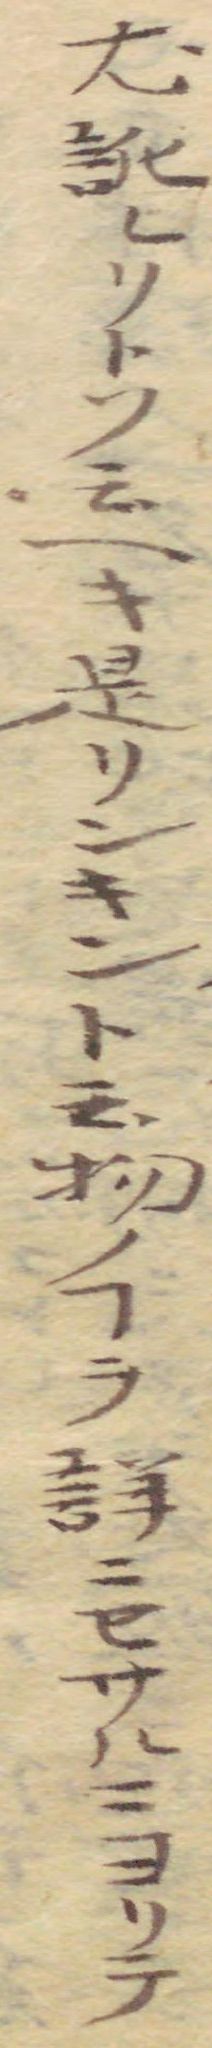尤訛レリトソ云ヘキ是リンキント云物ノコトヲ詳ニセサルニヨリテ
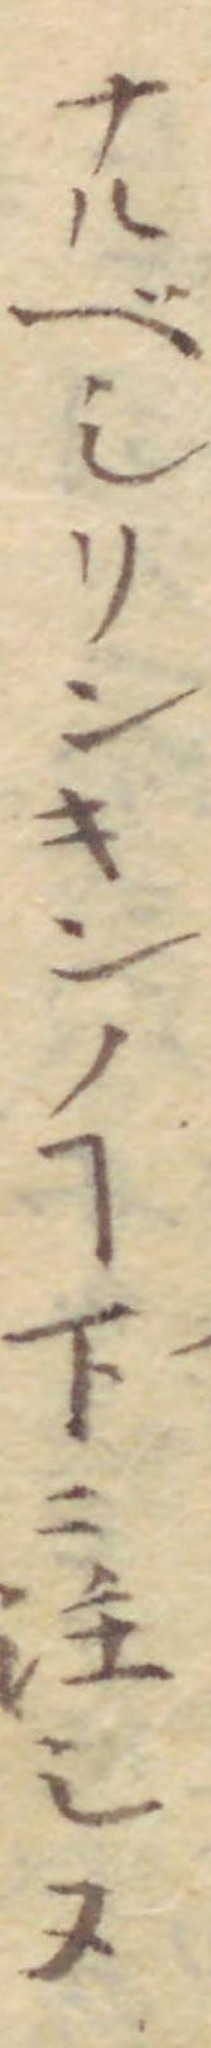ナルベシリンキンノコト下ニシ注シヌ
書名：鶯宿雑記. 巻263-264
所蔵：国立国会図書館 National Diet Library, JAPAN
